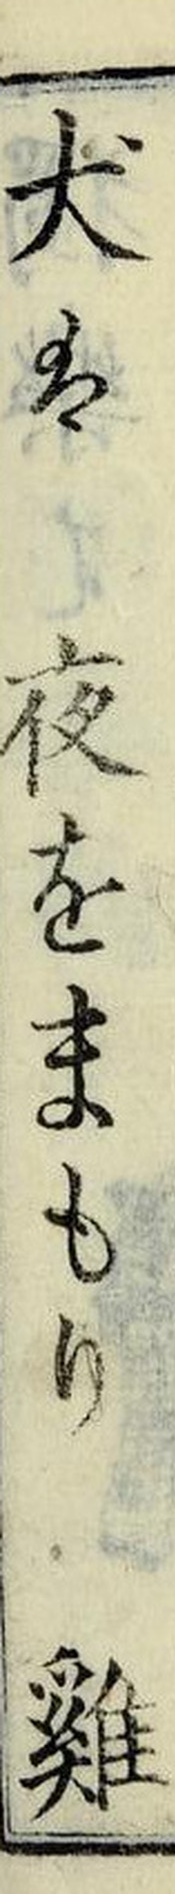犬は夜をまもり雞
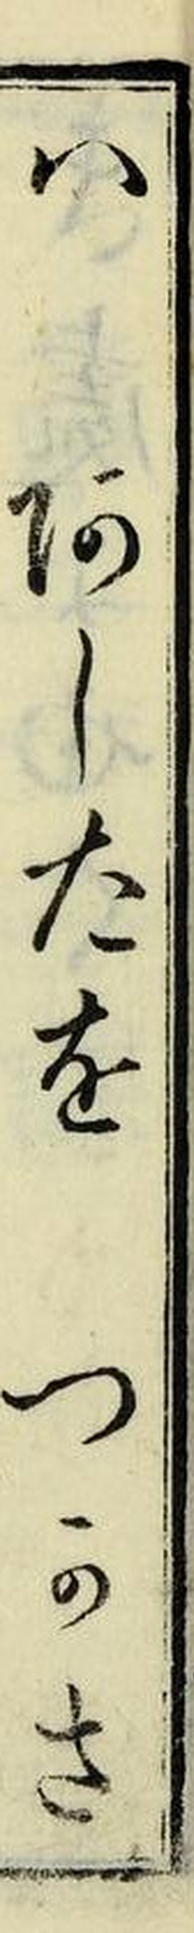はあしたをつかさ
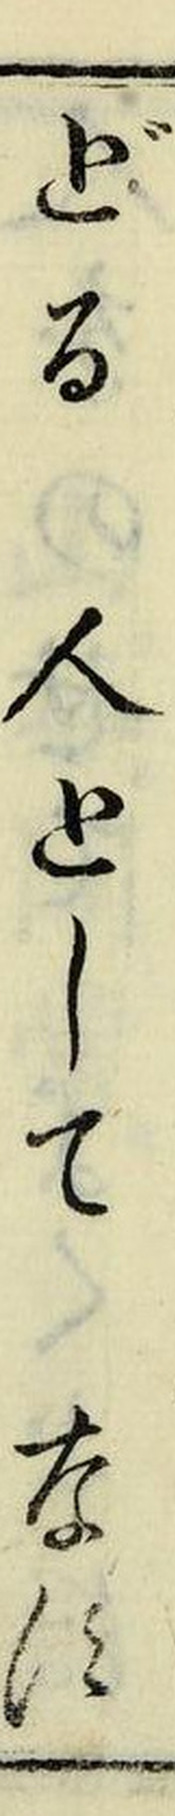どる人としてなす
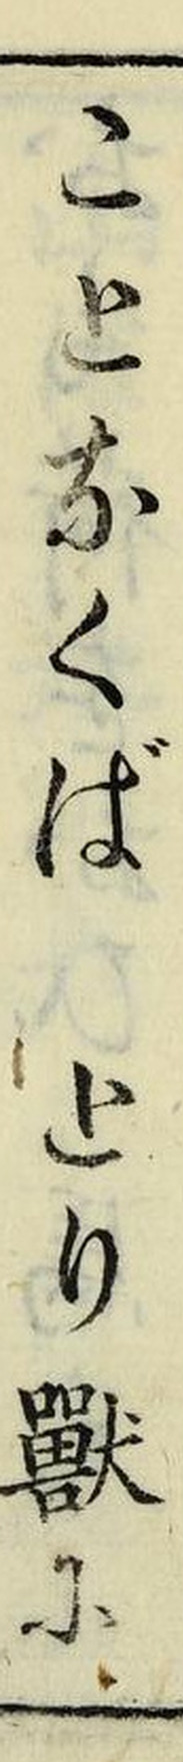ことなくばとり獣に
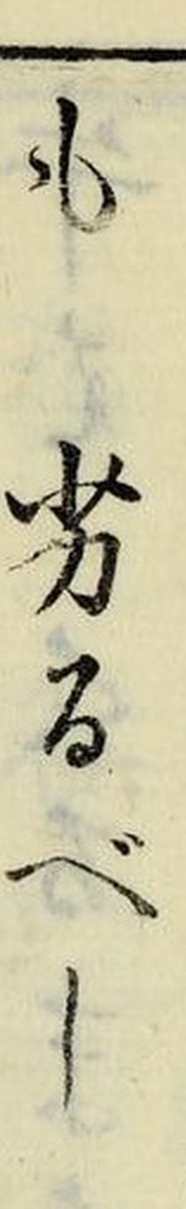も劣るべし
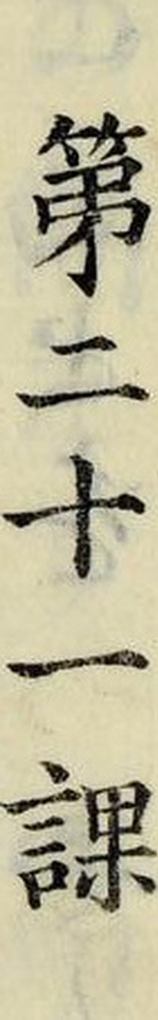第二十一課

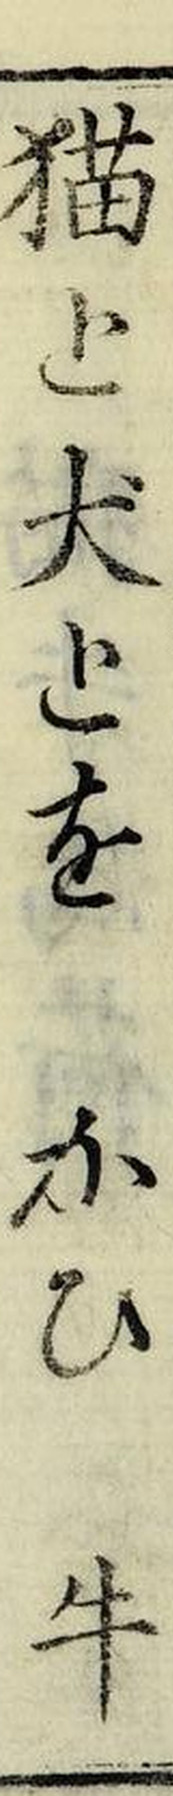猫と犬とをかひ牛
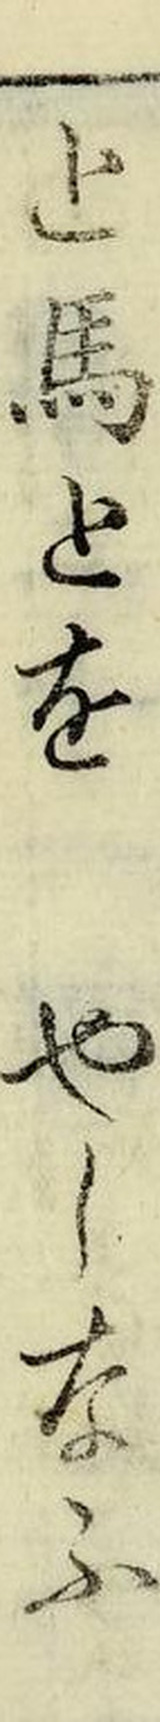と馬とをやしなふ
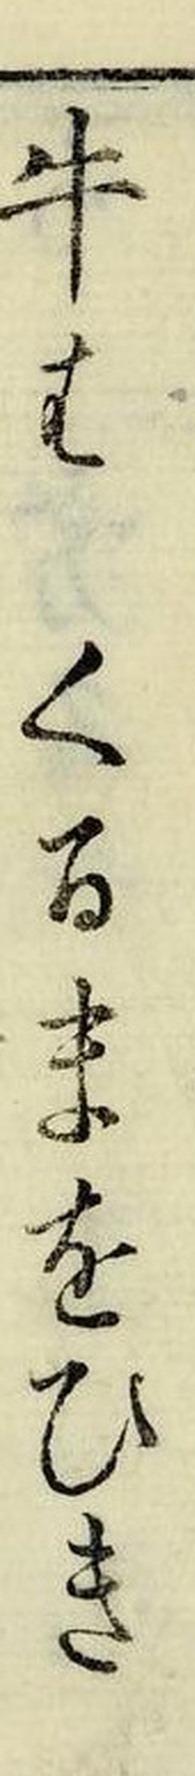牛はくるまをひき
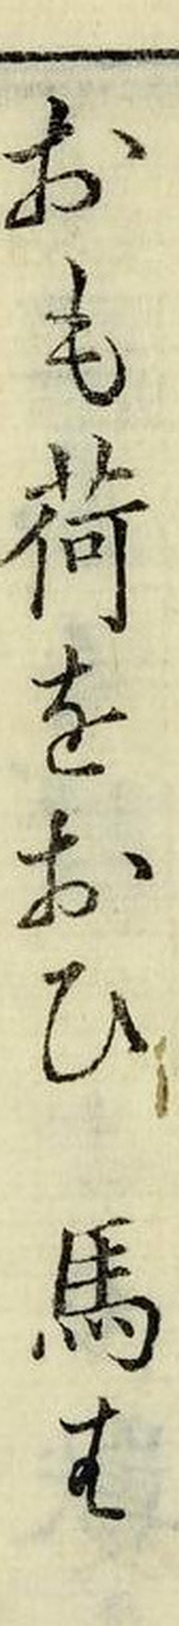おも荷をおひ馬は
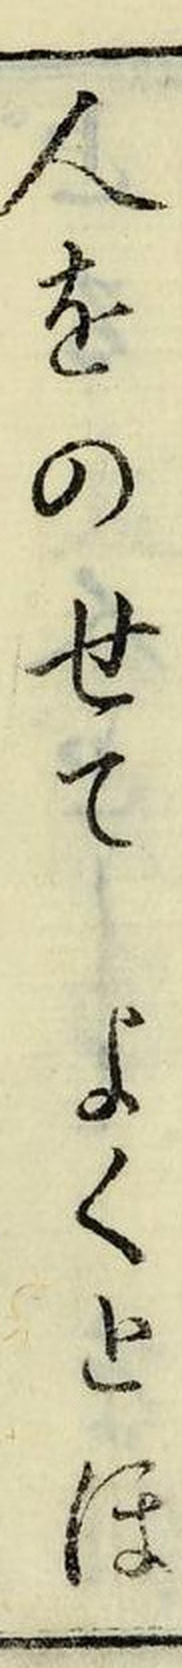人をのせてよくとほ
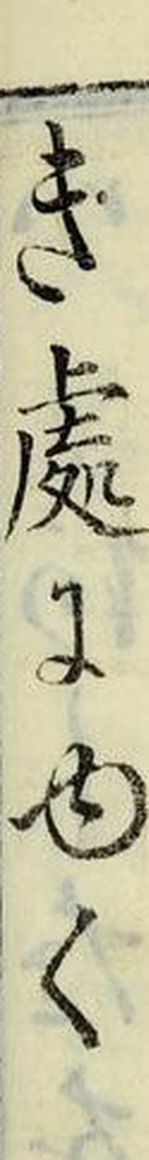き処にゆく
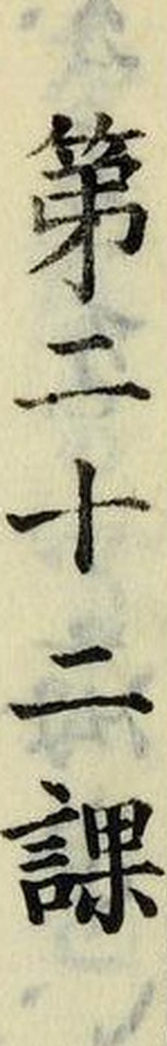第二十二課
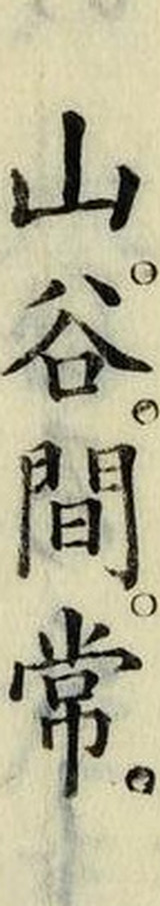山。谷。間。常。
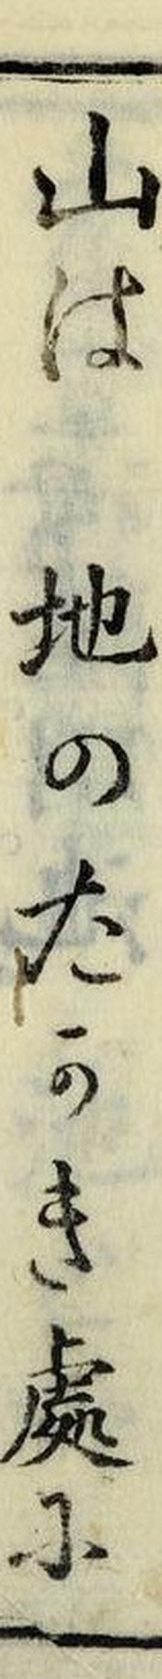山は地のたかき処に
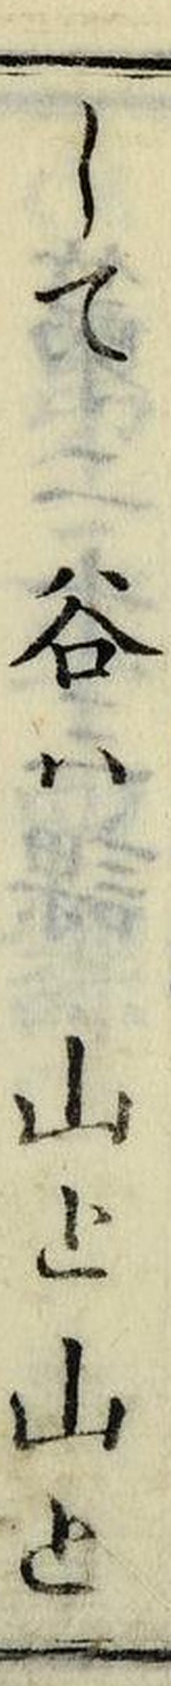して谷は山と山と
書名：小学読本 初等科 巻一
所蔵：福井県文書館 Fukui Prefectural Archives
